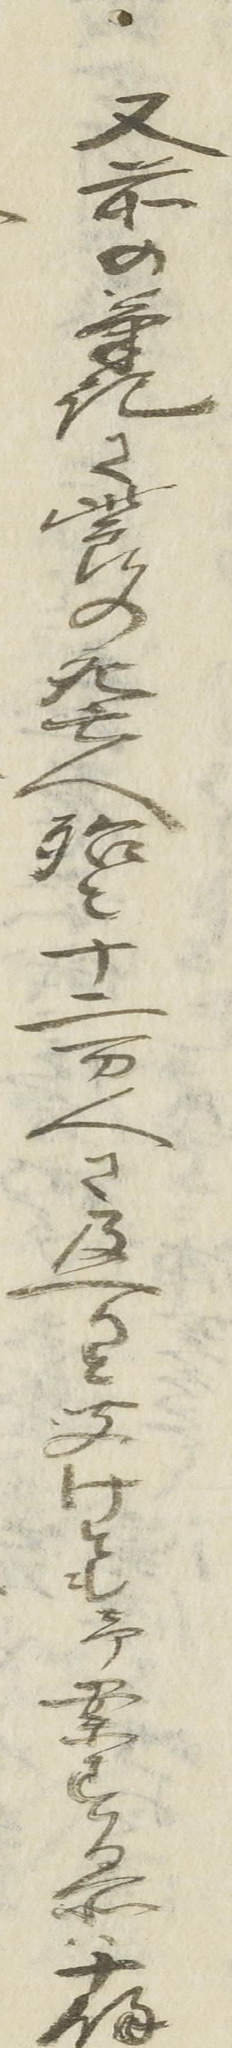一又前の筆記に此節の死亡人殆と十二万人に及へりと聞けとも予案する所ハ十余
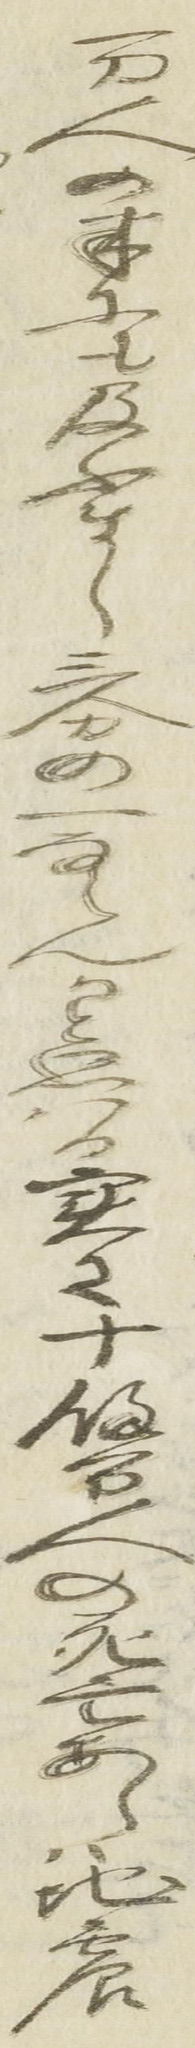万人の半ニも及ふまし三分の一ならんかと思ハる実に十余万人の死亡あらハ地震
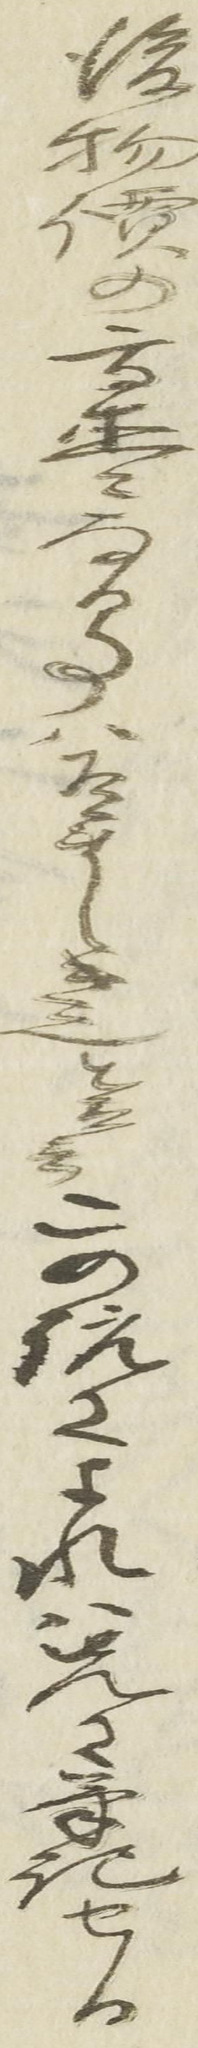後物価の高直二なる事ハ有ましき也と云々この説によれハ先に筆記セる
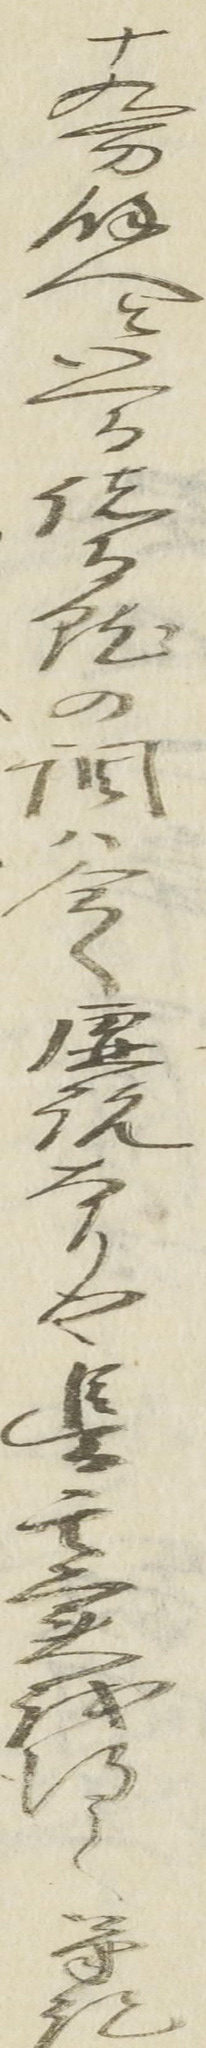十九万余人といへる諸寺院の調ハ全く虚説なりや追而其実を得く筆記
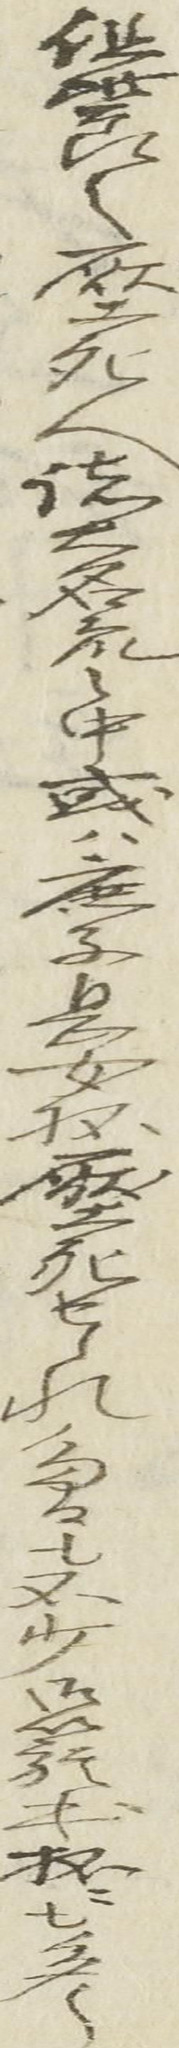すへき也但此節之圧死人諸大名衆之中或ハ庶子息女抔圧死セられたるも不少御籏本抔ニも多く
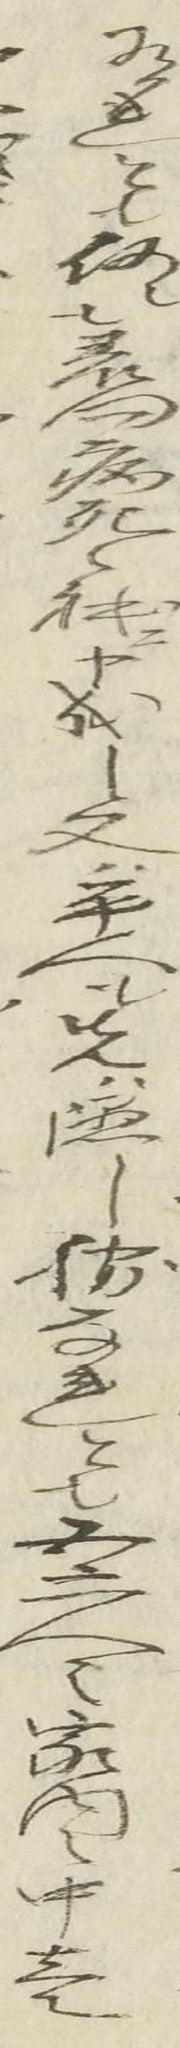有れとも何レも表向病死之躰ニ申成し又ハ死人も先ハ隠し勝なれとも五六人之家内之中壱
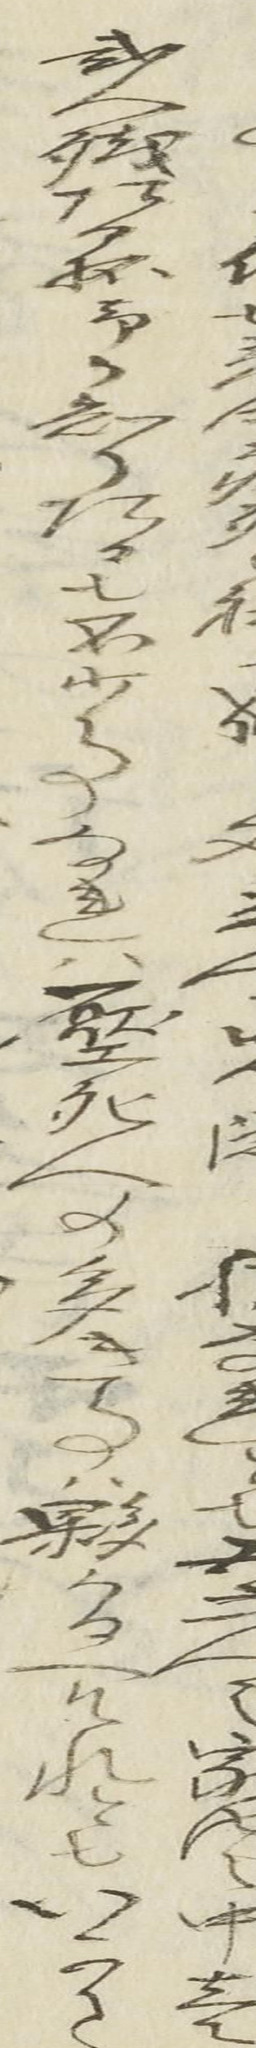弐人残たる抔予が知りたるも不少事なれハ圧死人の多き事ハ夥かるへケれともいかに
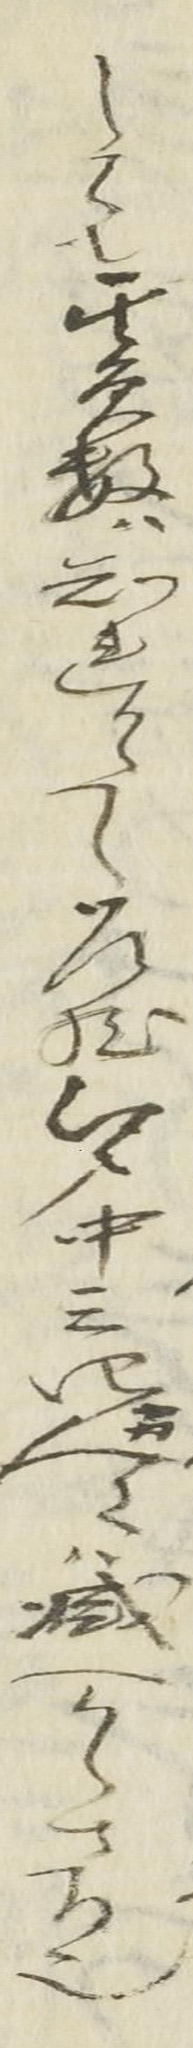しても其員数ハ知れかたし乍然江戸中三四人ニハ減へケらさる也
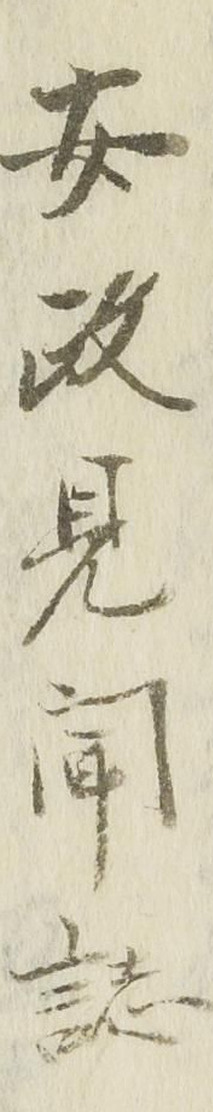安政見聞誌

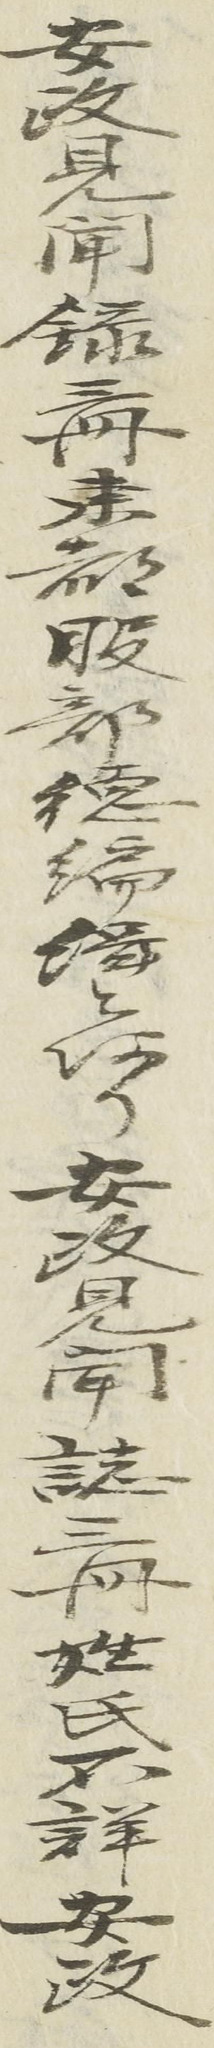安政見聞録三冊東都服部徳編輯とあり安政見聞誌三冊姓氏不詳安政
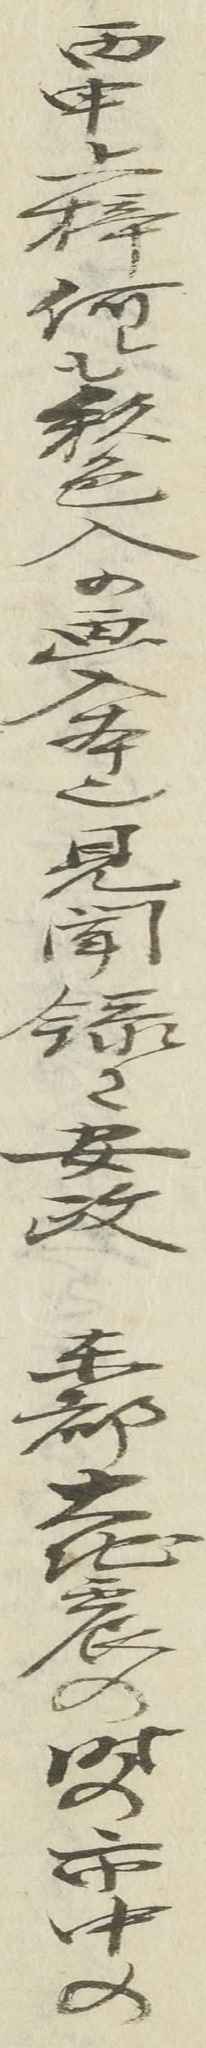丙申上梓何レも彩色入の画入本也見聞録に安政東都大地震の時の市中の
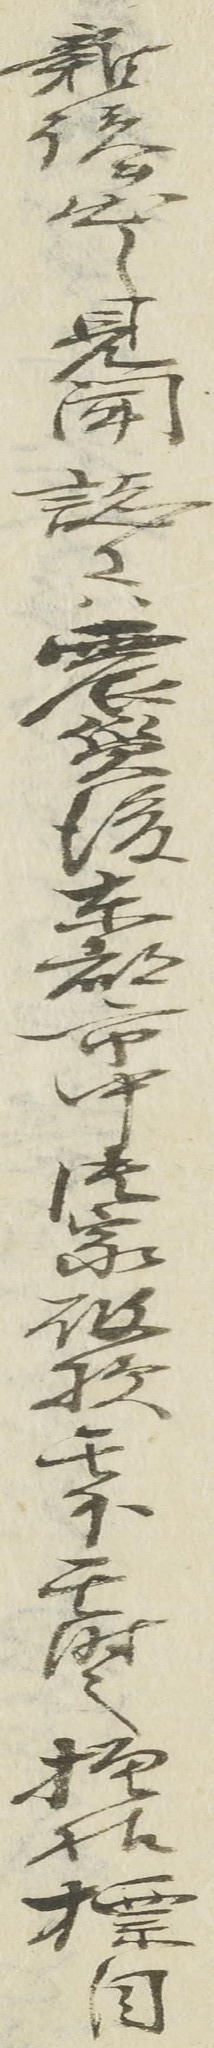雑談ヲ出し見聞誌にハ震災後東都市中潰家破損其外其時之模様標目
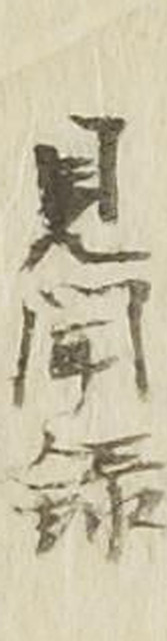見聞録
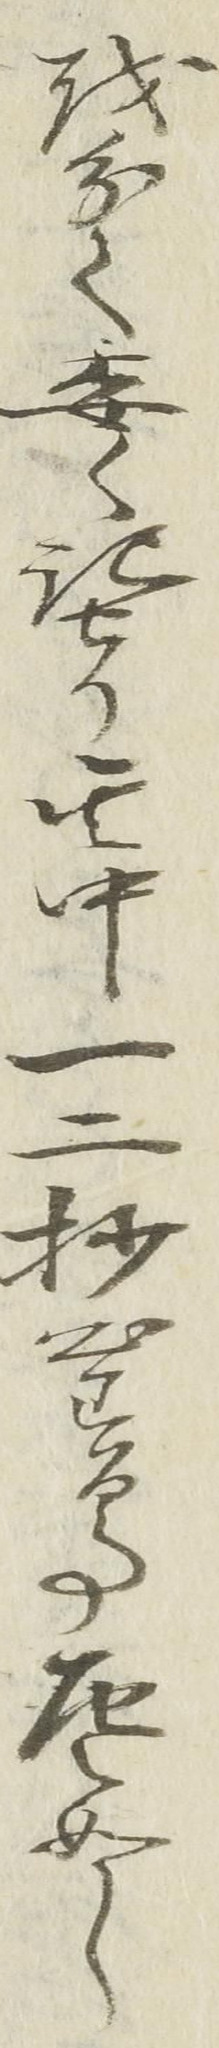を分て委く記セり其中一二抄たる事左之如し
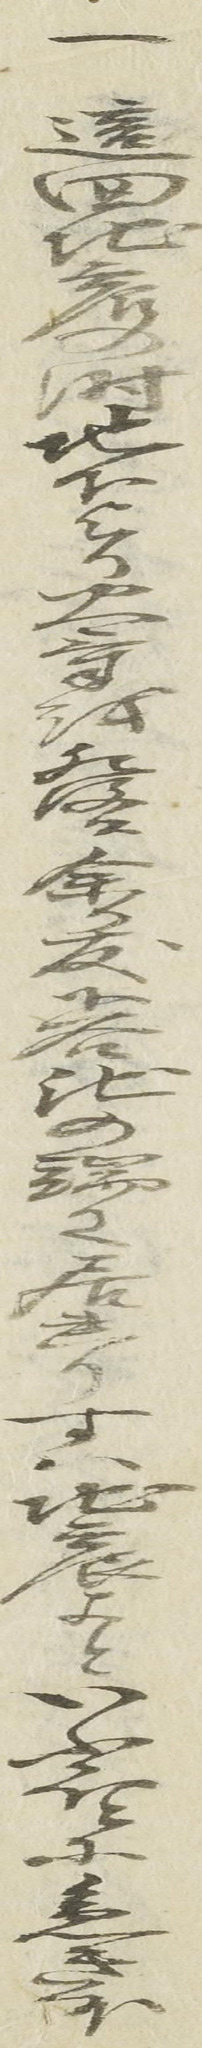一這回地震の時地下より火気を発ス余か友下谷池の端ニ居れりすハ地震よといふほとに急き外
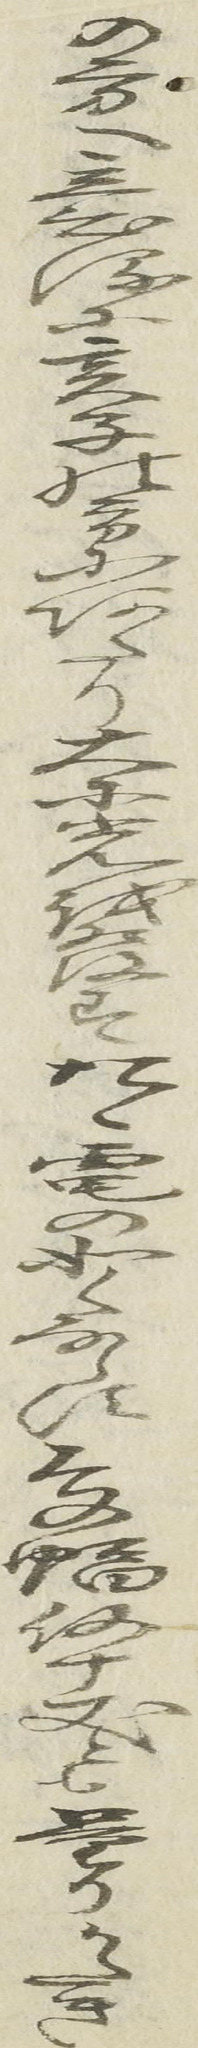の方へ立出様に亥子の方にあたり大に光を発すたゝ電の如くならすその幅何十丈とも量りかたき
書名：安政乙卯江戸大地震筆記　安政丙辰八月大阪大雷雨之記追加　安政三辰年七月松前辺大地震并八月大風雨記録
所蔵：東京大学地震研究所図書室 Earthquake Research Institute Library, The University of Tokyo, JAPAN
